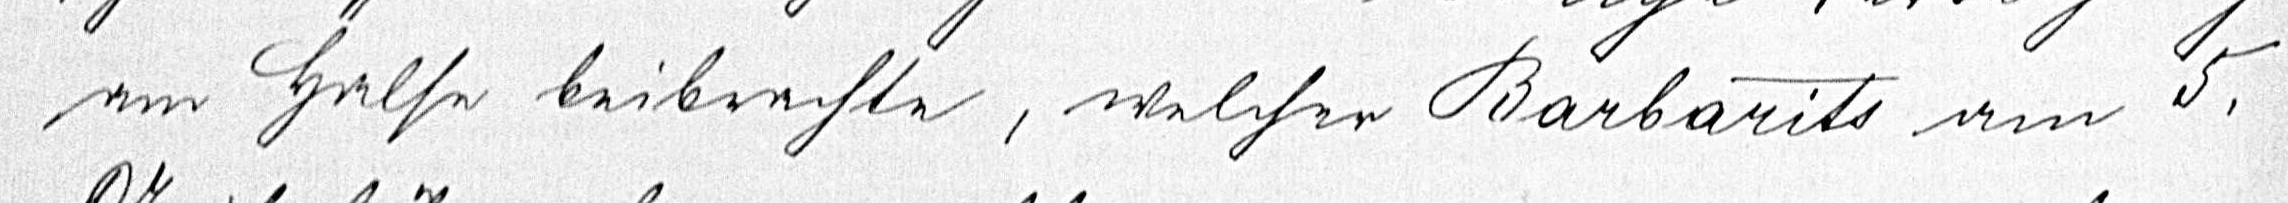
am Halse beibrachte, welcher Barbarits am 5.
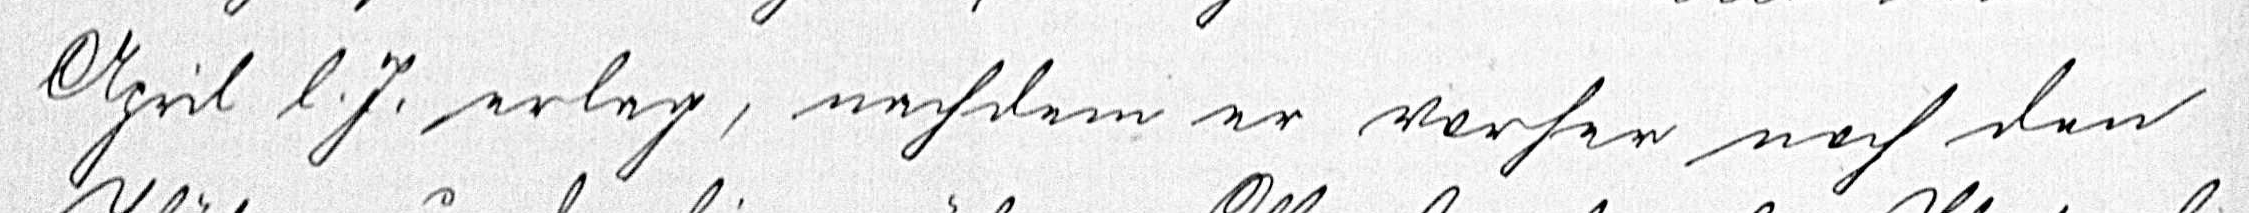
April l. J. erlag, nachdem er vorher noch den
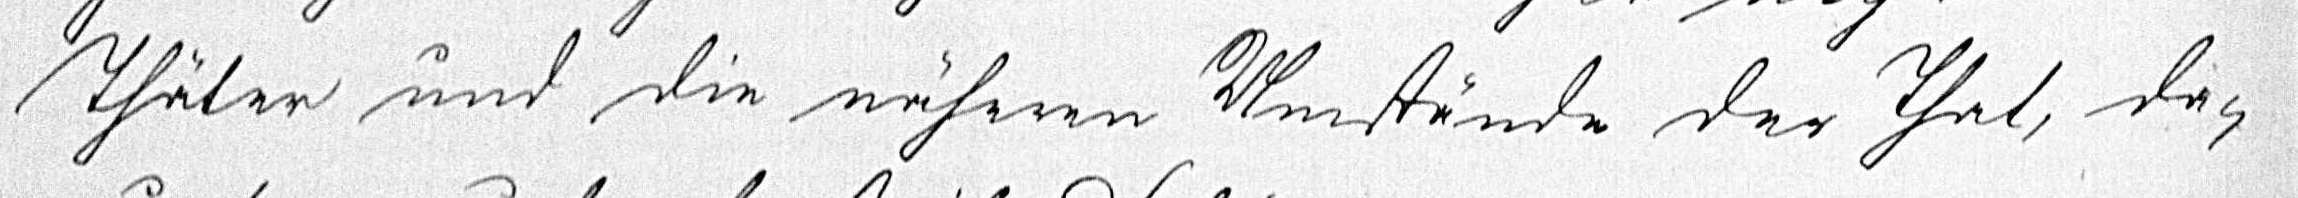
Thäter und die näheren Umstände der That, da¬
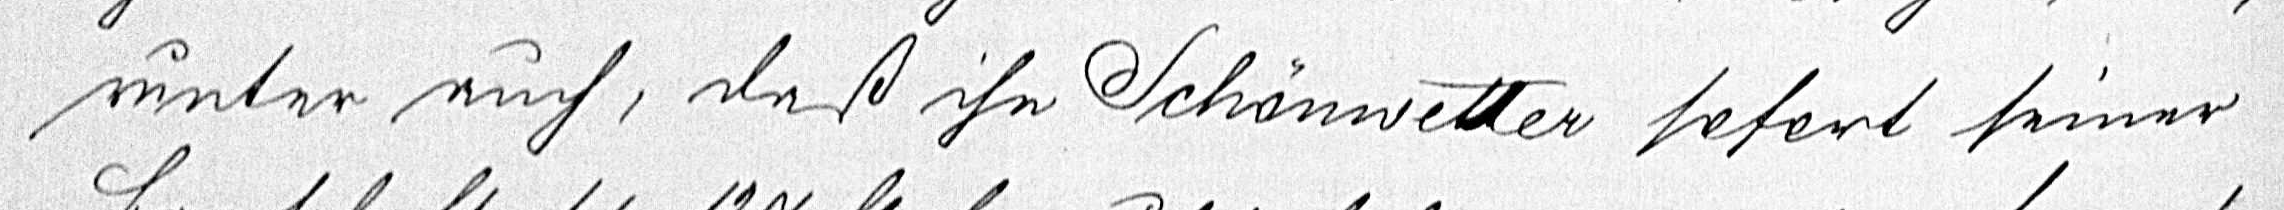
runter auch, daß ihn Schönwetter sofort seiner
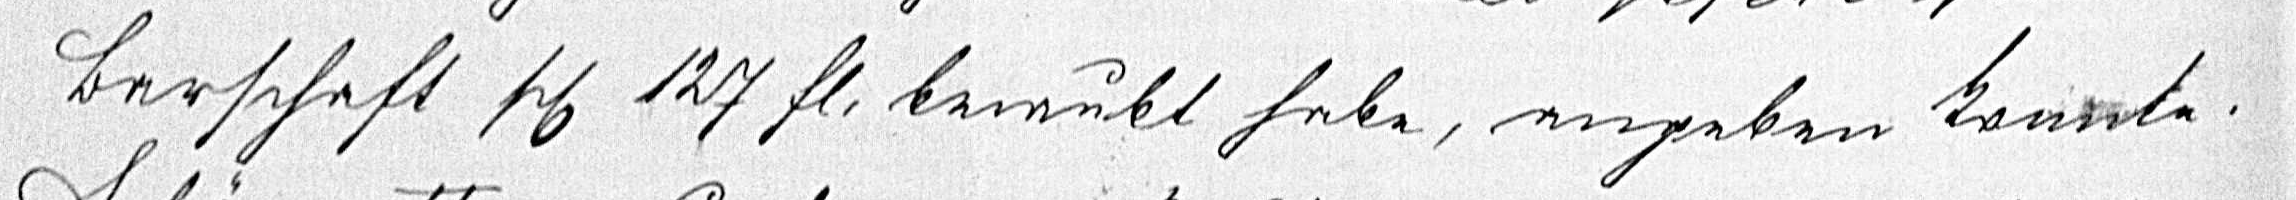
Barschaft sc6 127fl beraubt habe, angeben konnte.
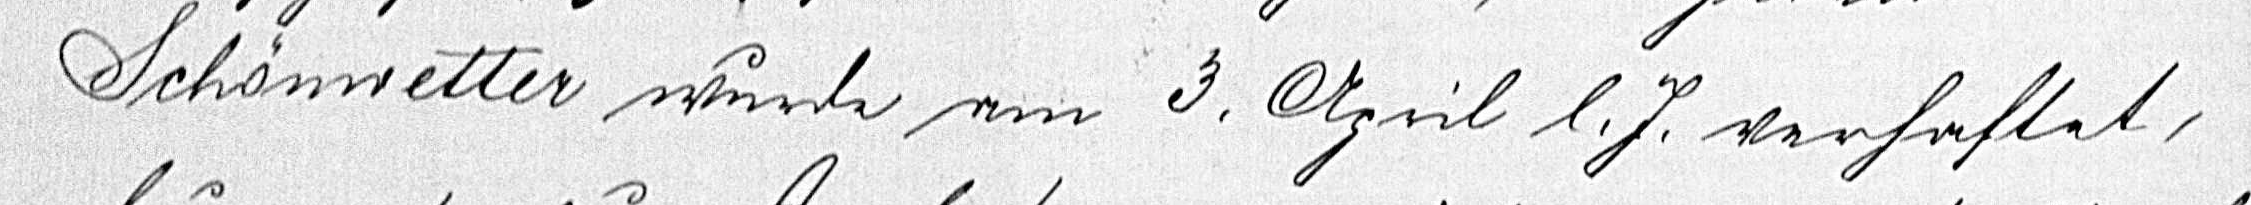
Schönwetter wurde am 3. April l. J. verhaftet,
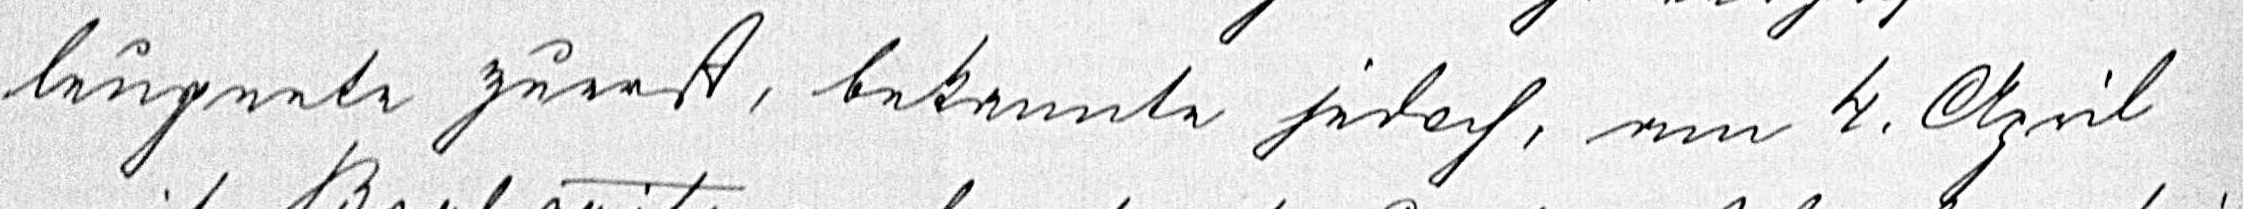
leugnete zuerst, bekannte jedoch, am 4. April
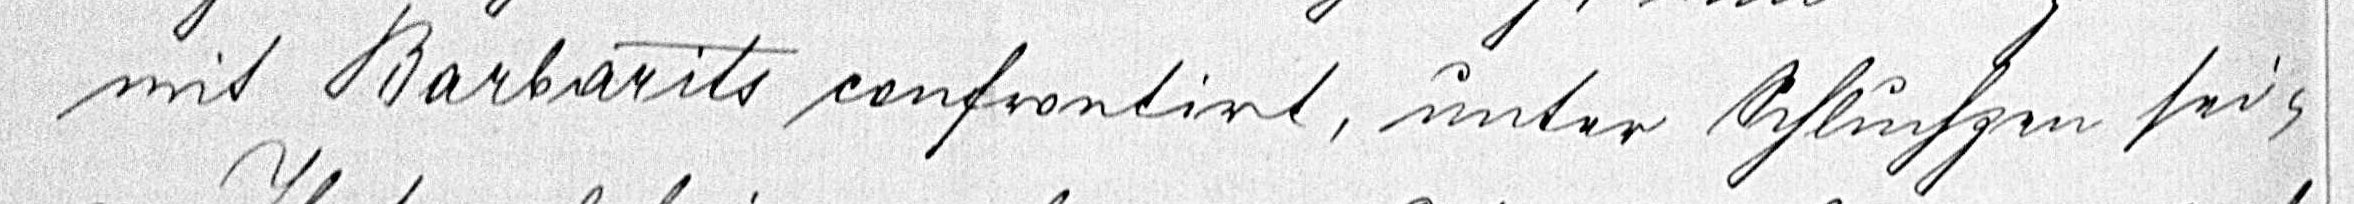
mit Barbarits confrontirt, unter Schluchzen sei¬
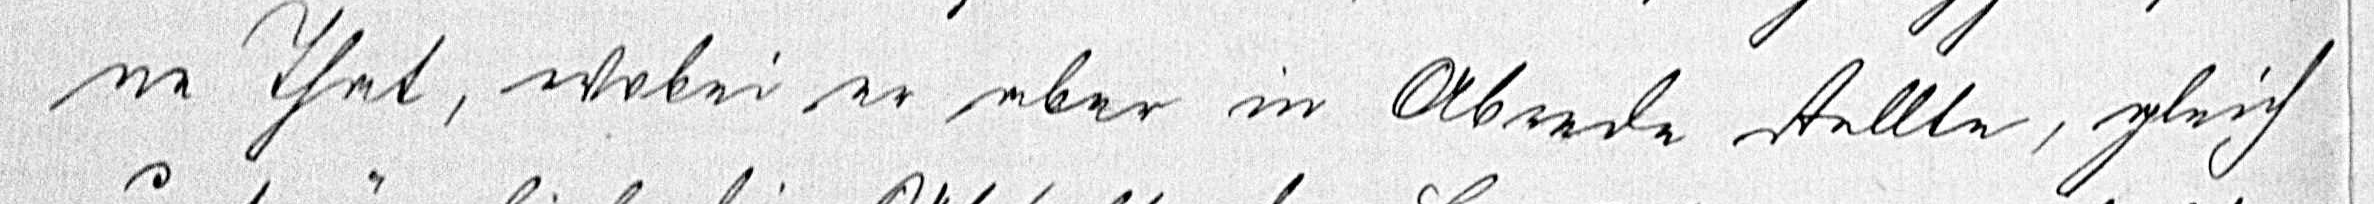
ne That wobei er aber in Abrede stellte, gleich
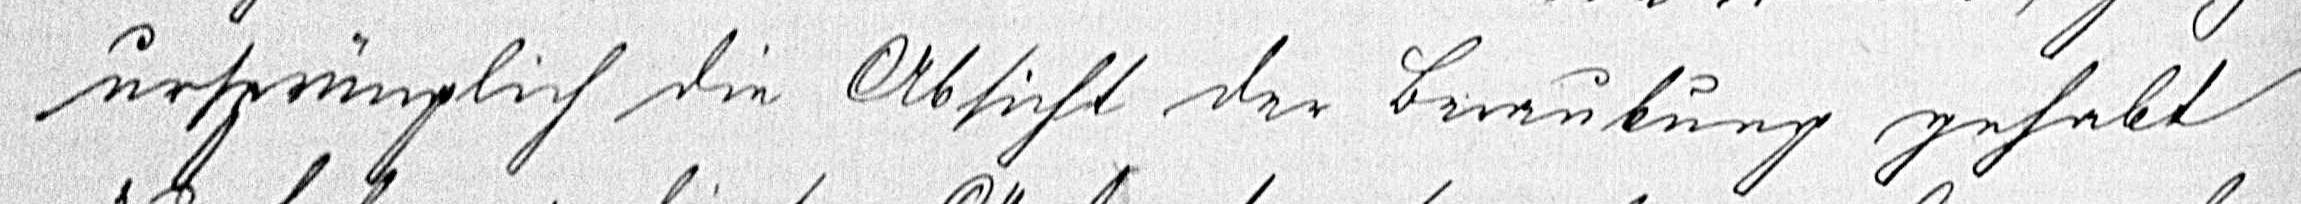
ursprünglich die Absicht der Beraubung gehabt
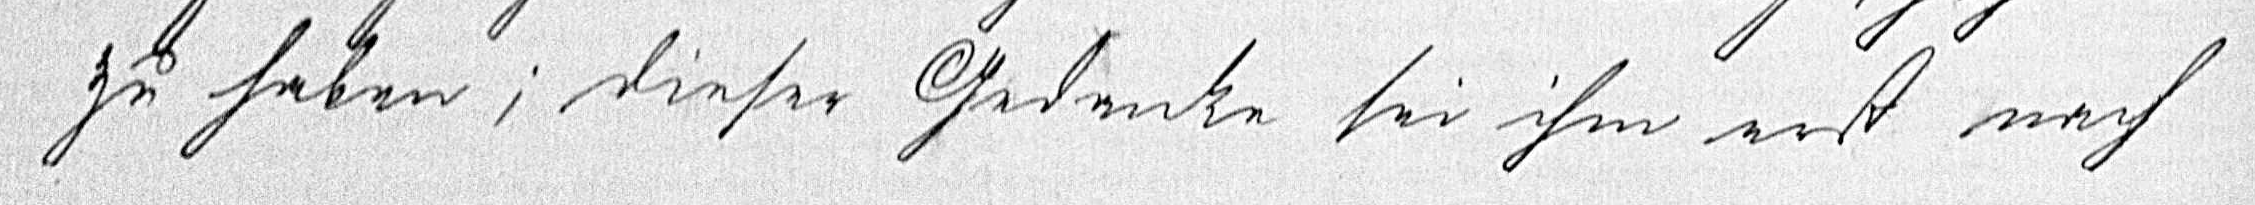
zu haben; dieser Gedanke sei ihm erst nach
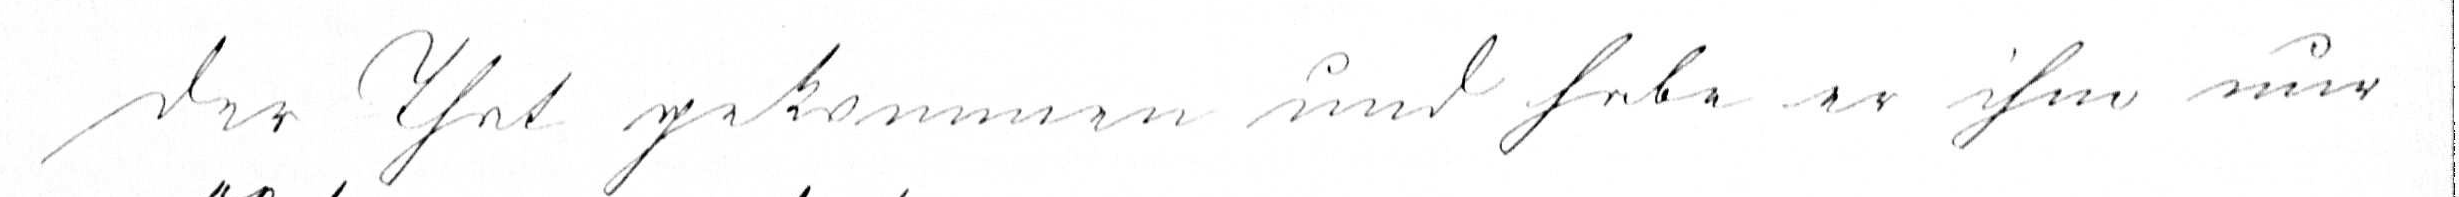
der That gekommen und habe er ihm nur
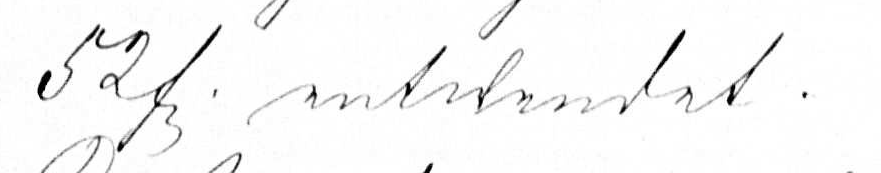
52f entwendet.
